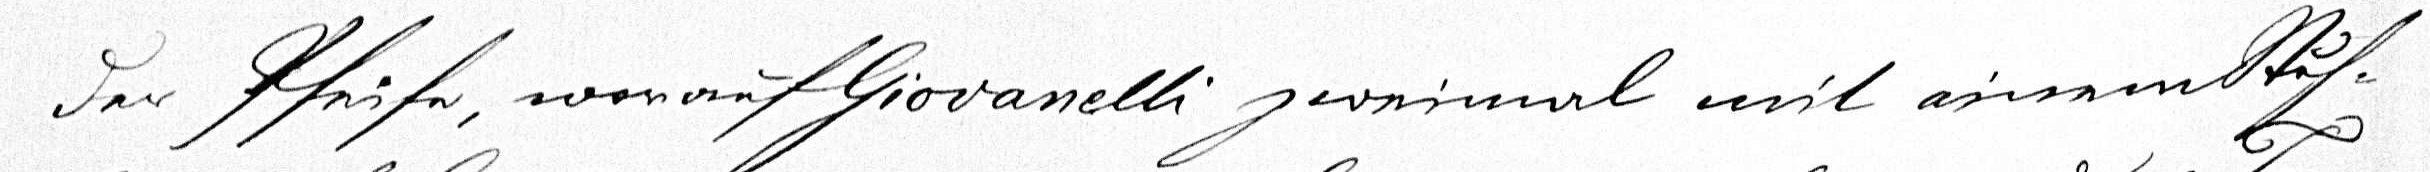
der Pfeife, wovon Giovanelli zweimal mit einem Stuh¬
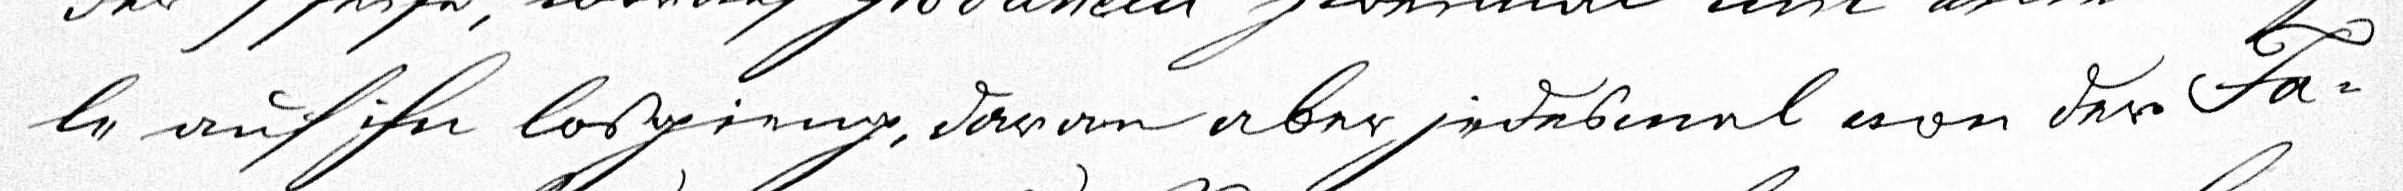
le auf ihn losgieng, daran aber jedesmal von der Fa¬
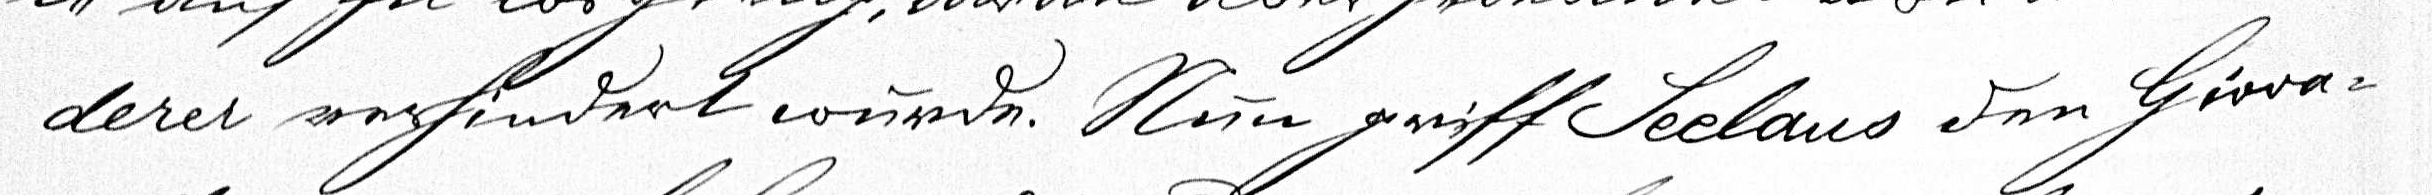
derer verhindert wurde. Nun griff Seelaus den Giova¬
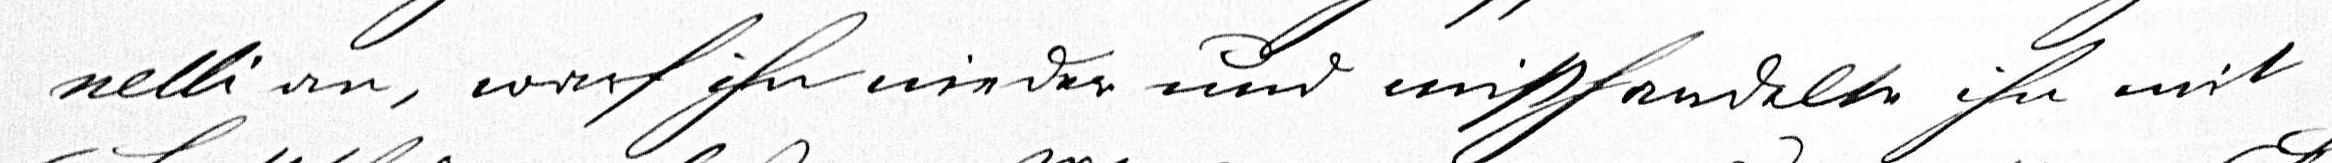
nelli an, warf ihn wieder und mißhandelte ihn mit
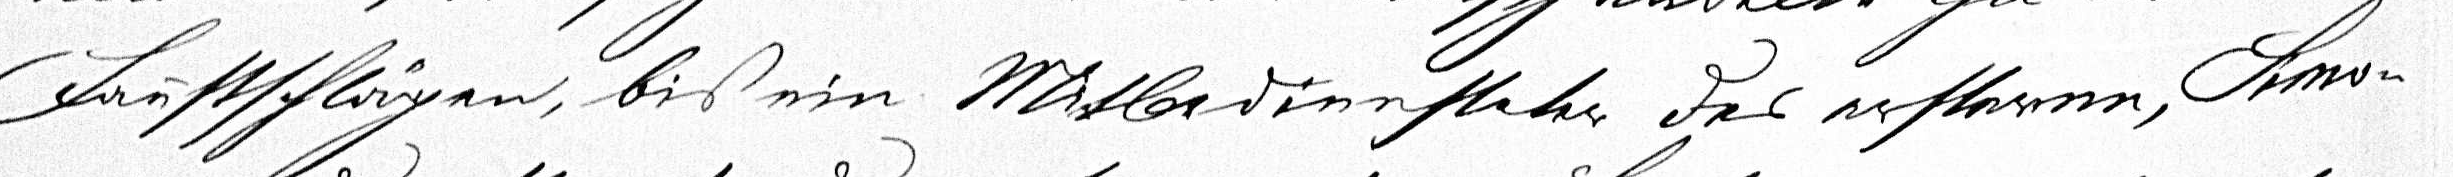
Faustschlägen, bis ein Mitbediensteter des ersteren, Simo¬
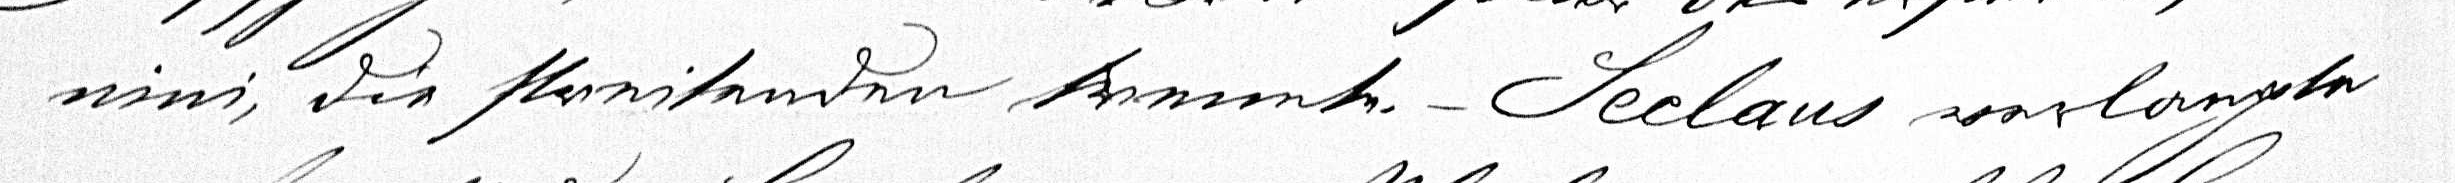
nini, die streitenden trennte. Seelaus verlangte
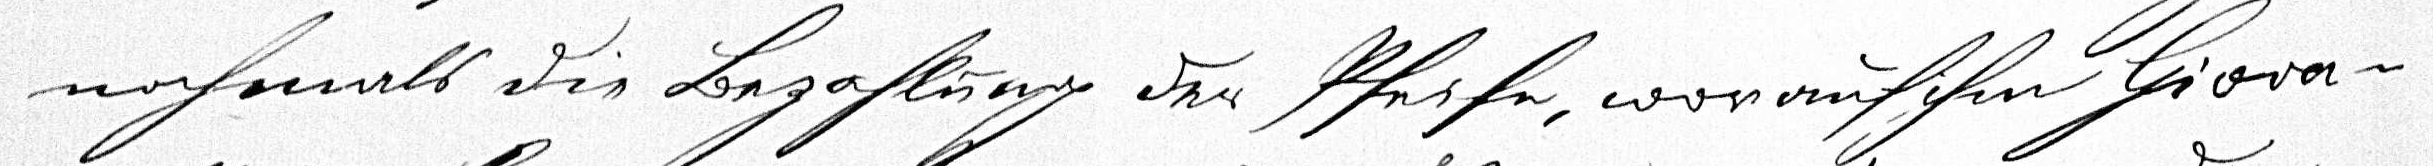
nochmals die Bezahlung der Pfeife, worauf ihm Giova¬
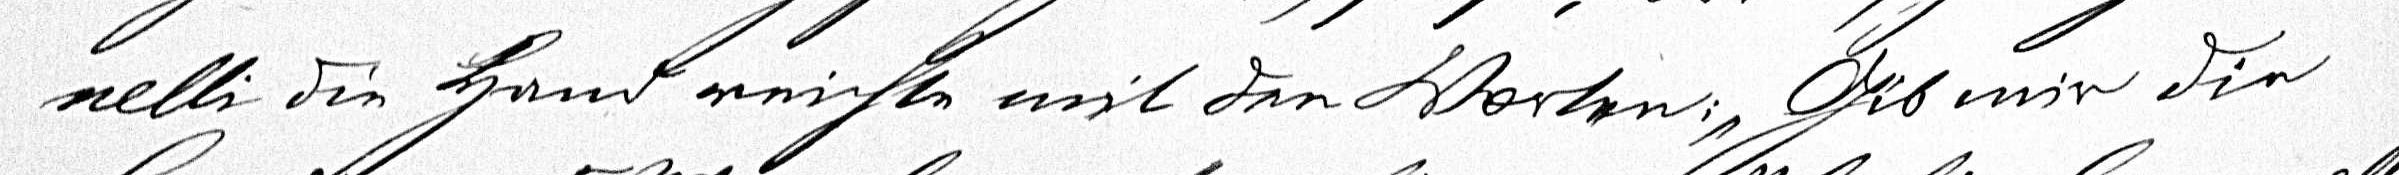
nelli die Hand reichte mit den Worten: „Big mir die
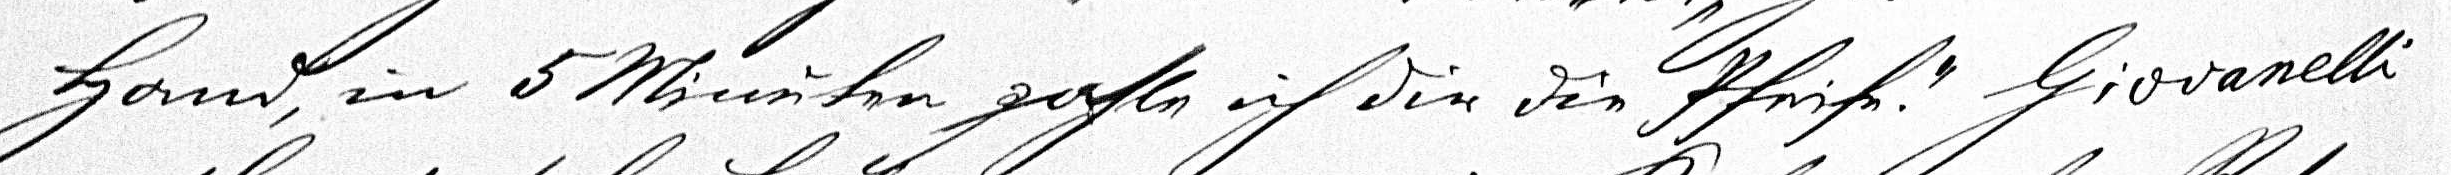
Hand, in 5 Minuten zahle ich dir die Pfeife.“ Giovanelli
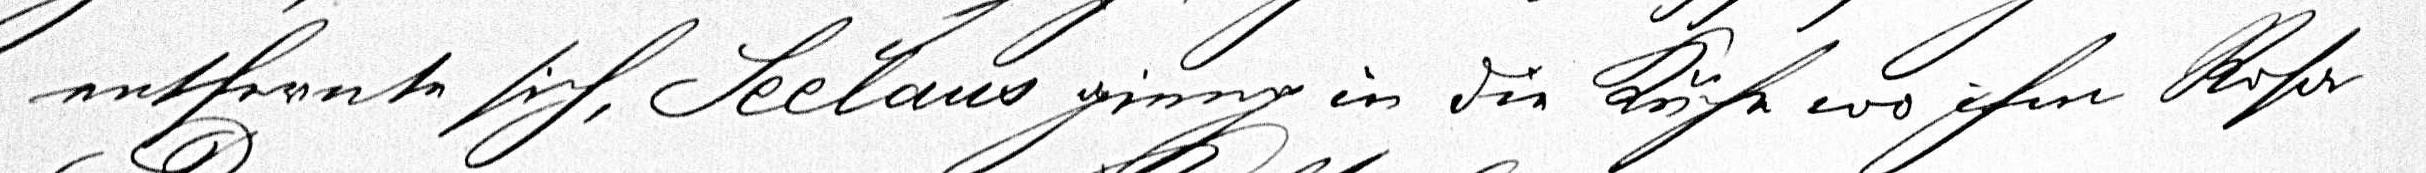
entfernte sich, Seelaus gieng in die Küche woh ihm Rosa
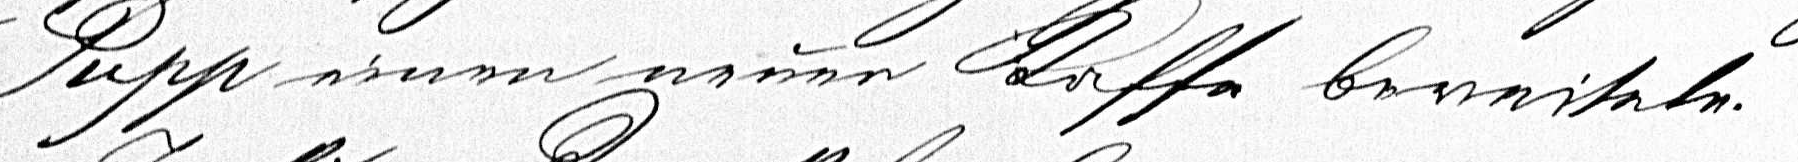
Pupp einen neuen Kaffe bereitete.
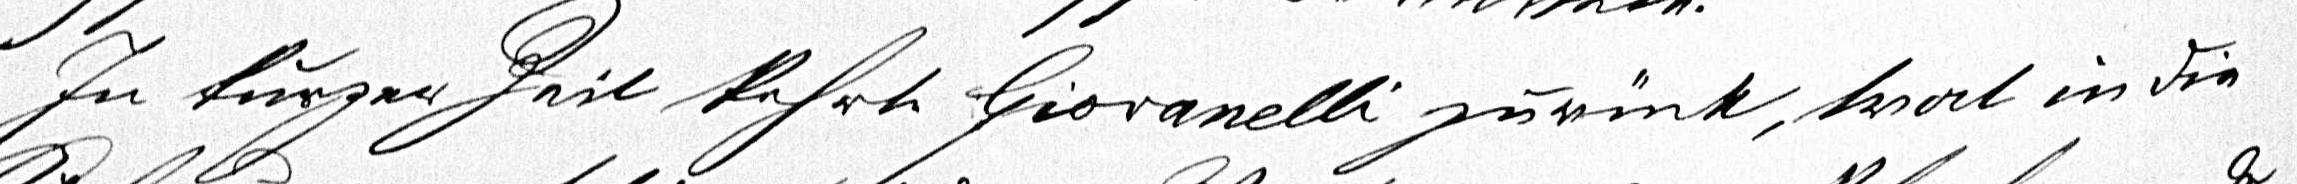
In kürzer Zeit kehrte Giovanelli zurück, trat in die
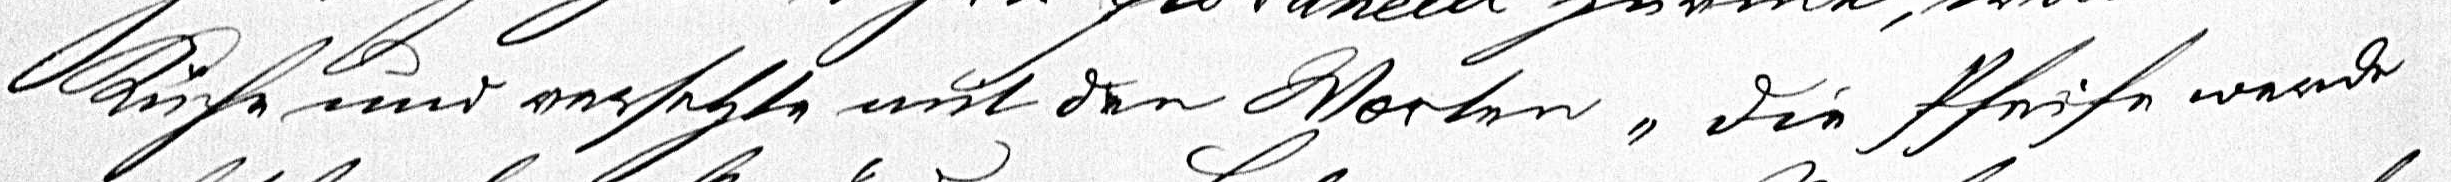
Küche und versetzte mit den Worten „die Pfeife werde
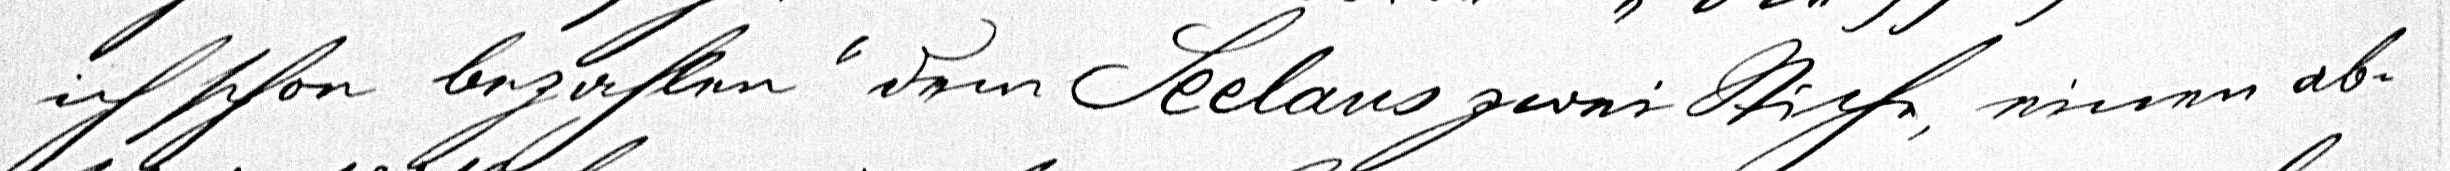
ich schon bezahlen“ dem Seelaus zwei Stiche, einen ab¬
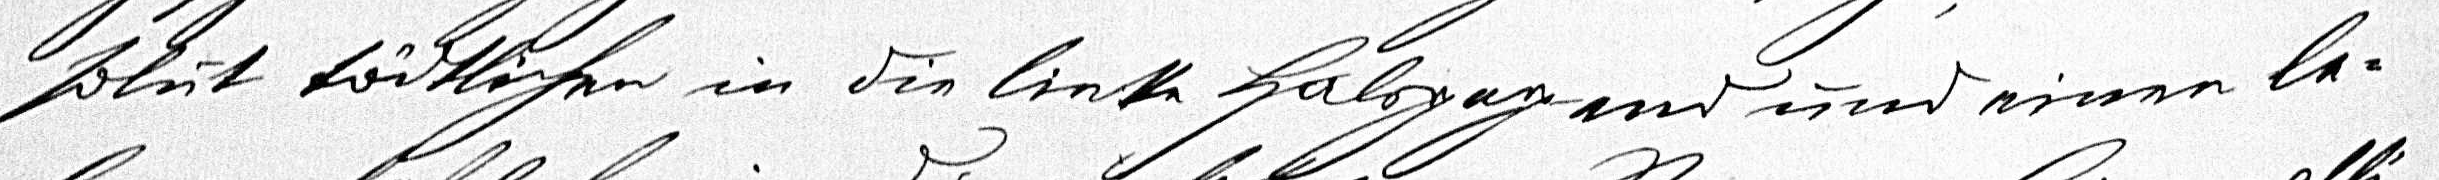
solut tödtlichen in die linke Halsgegend und einen le¬
